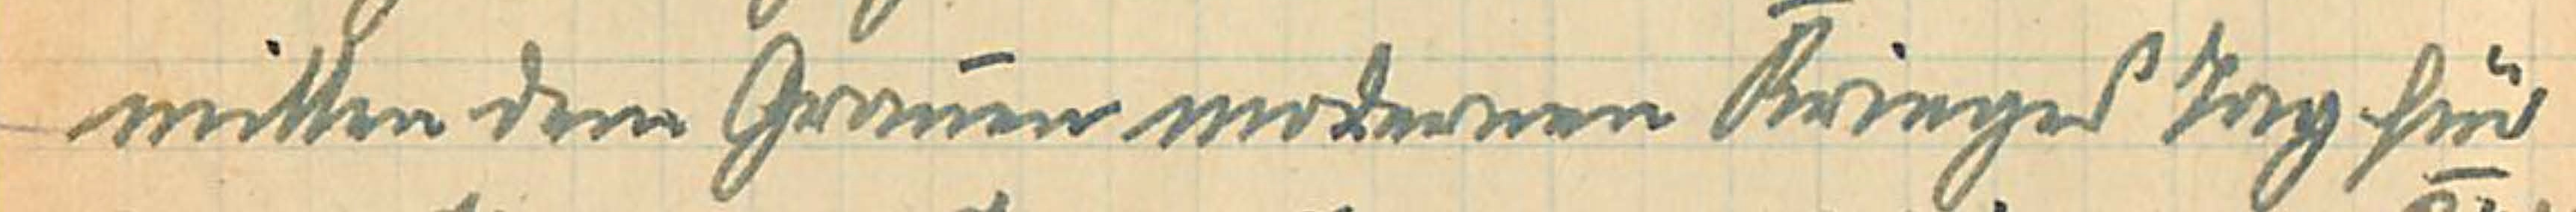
mitten dem Grauen modernen Krieges Tag für
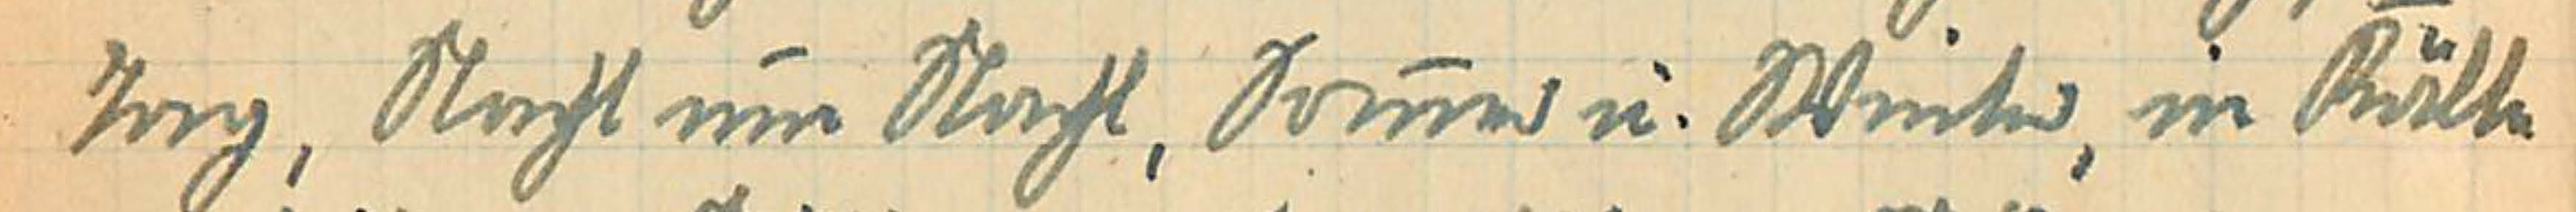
Tag, Nacht um Nacht, Sommer u. Winter, in Kälte
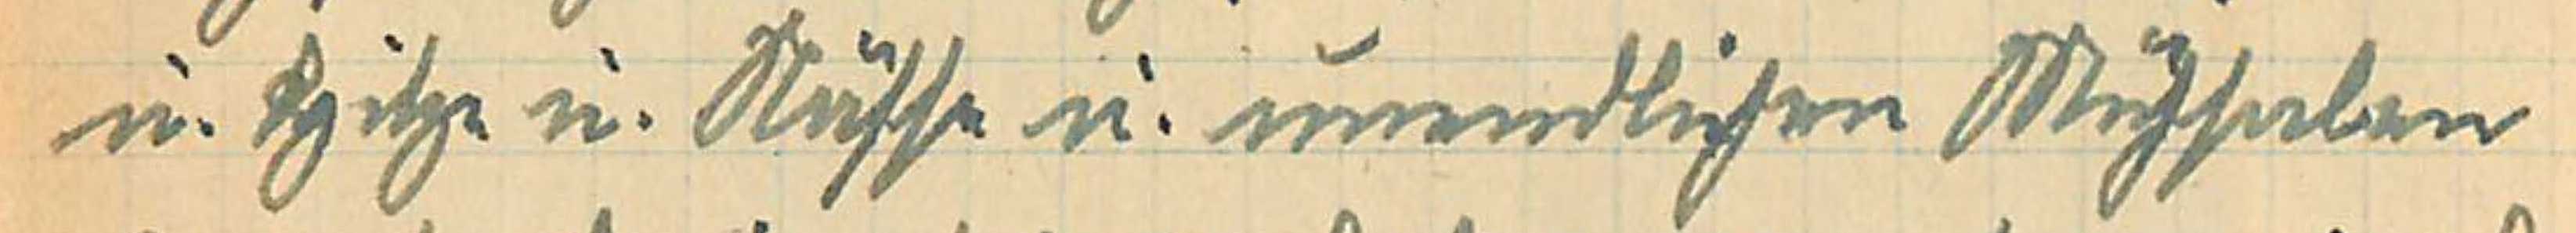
u. Hitze u. Nässe u. unendlichen Mühsalen
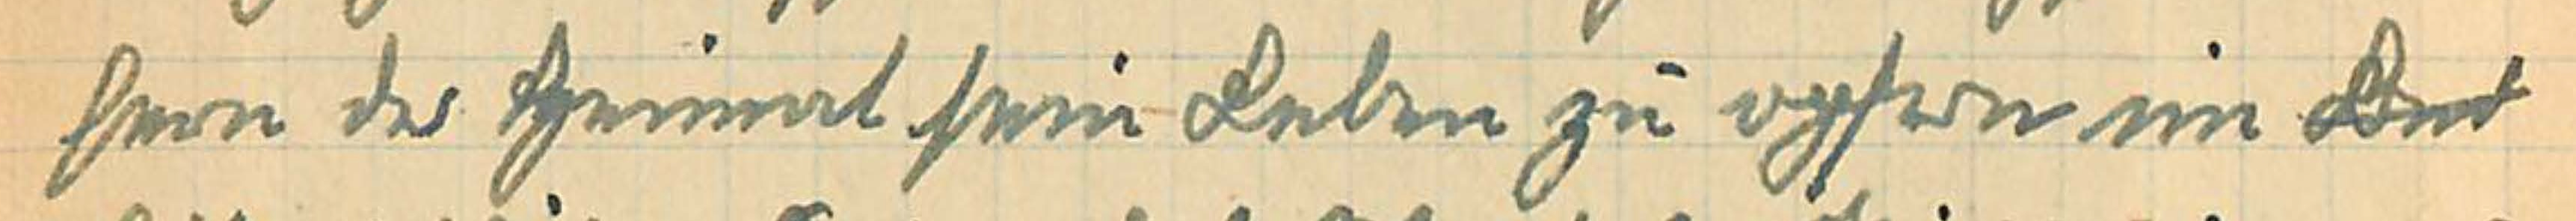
fern der Heimat sein Leben zu opfern im Bed
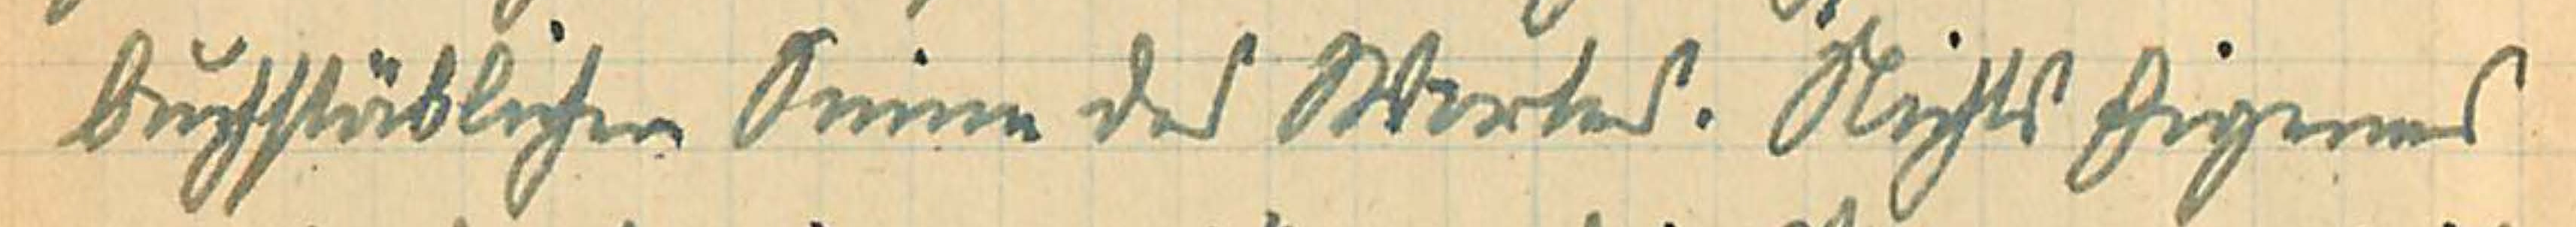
buchstäblichen Sinne des Wortes. Nichts Eigenes
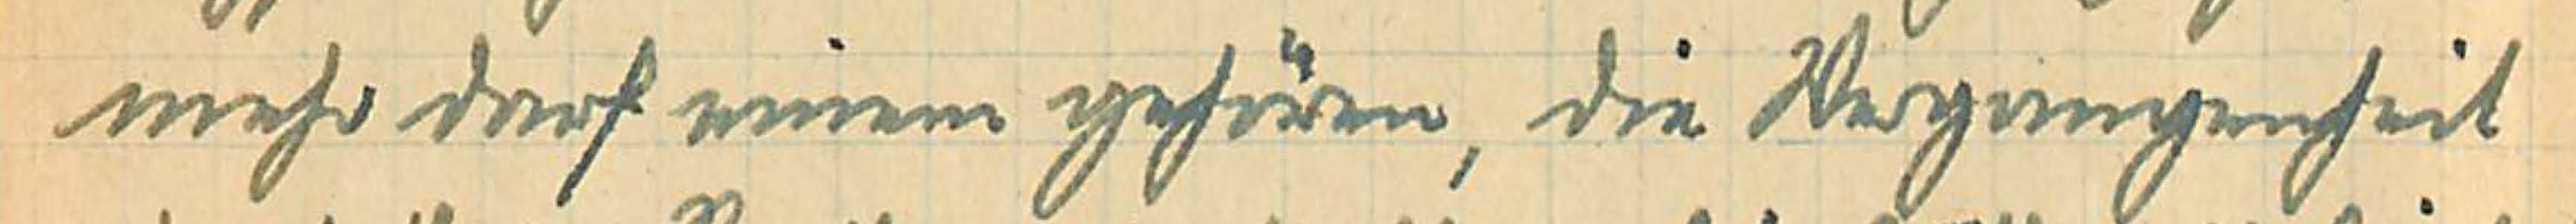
mehr darf einem gehören, die Vergangenheit
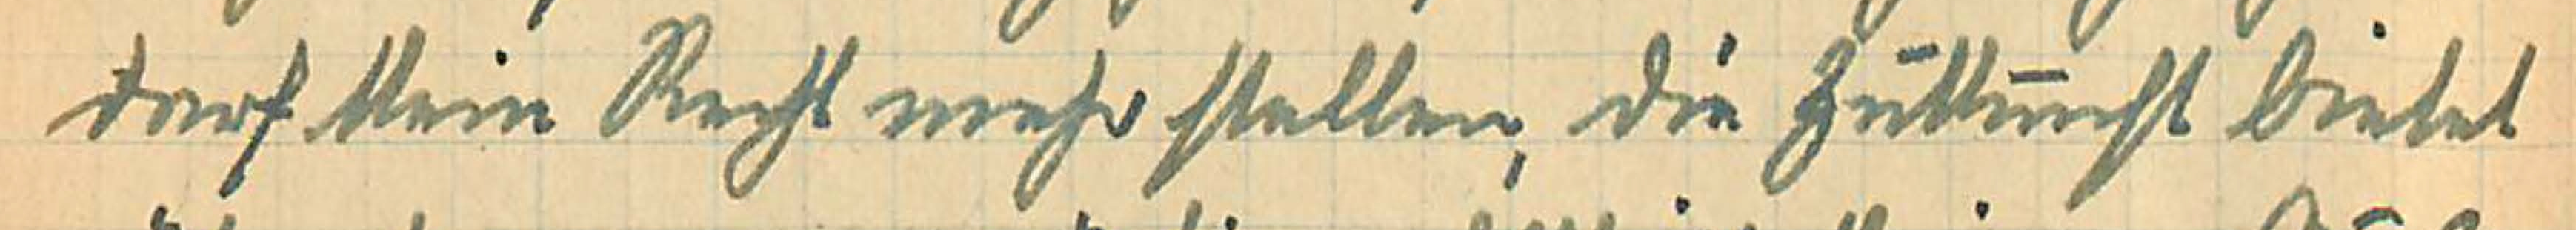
darf keine Recht mehr stellen, die Zukunft bietet
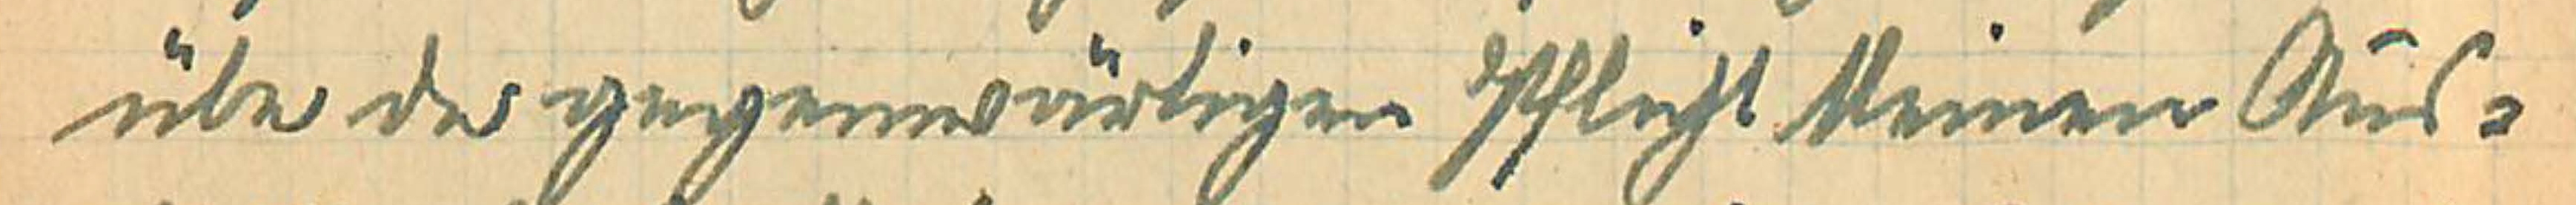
über der gegenwärtigen Pflicht keinen Aus-
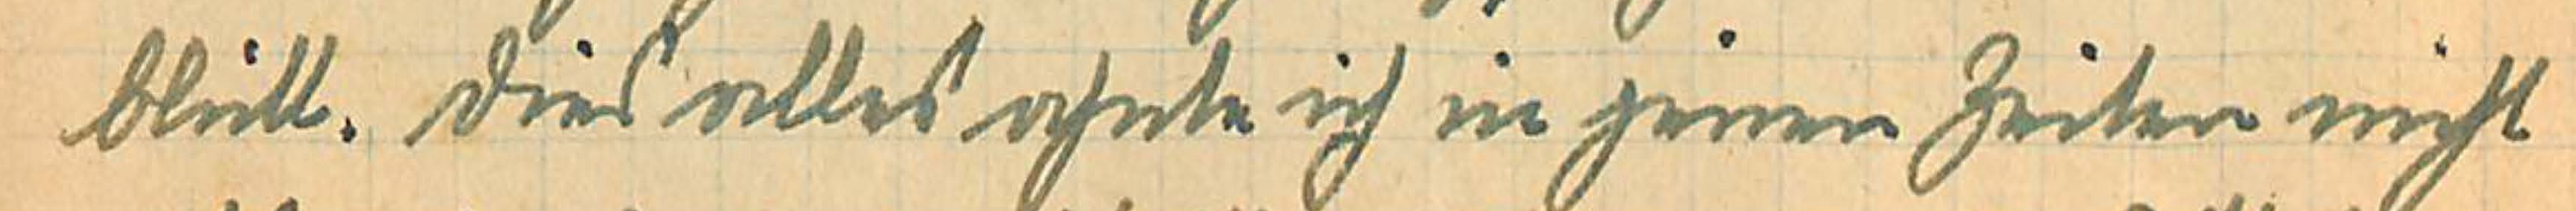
blick. Dies alles ahnte ich in jenen Zeiten nicht
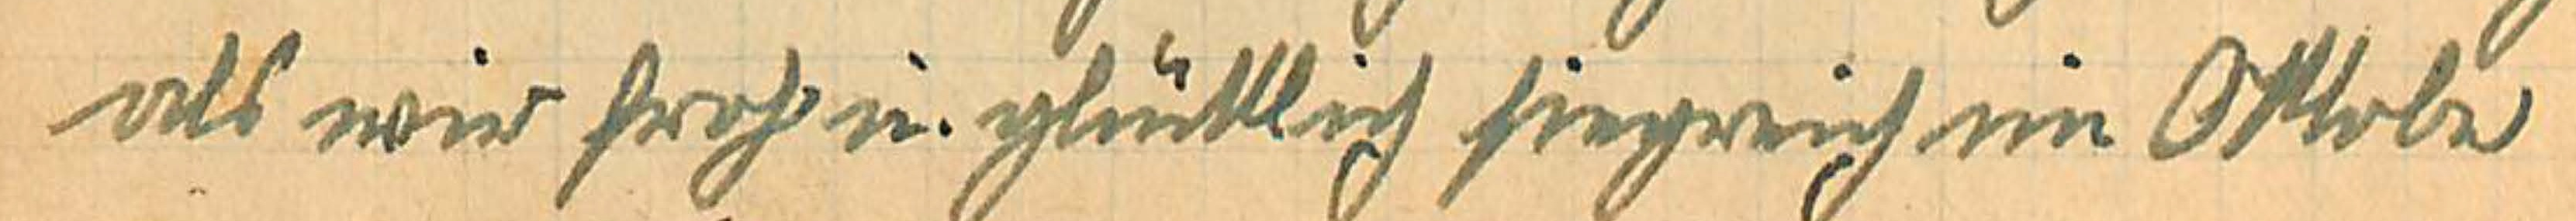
als wir froh u. glücklich siegreich im Oktober
